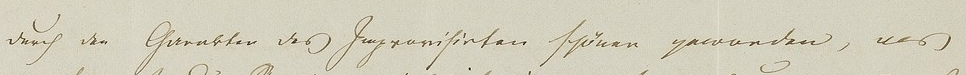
durch den Charakter des Improvisirten schöner geworden, als
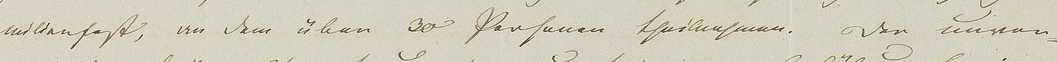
milienfest, an dem über 30 Personen theilnahmen. Der unver-
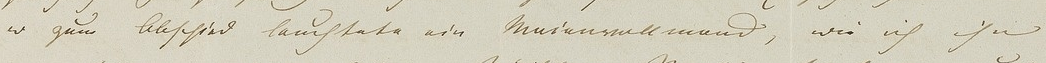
& zum Abschied leuchtete ein Maienvollmond, wie ich ihn
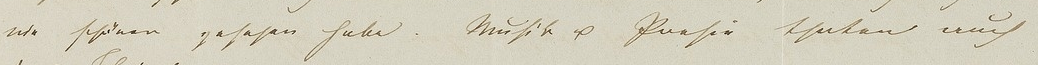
nie schöner gesehen habe. Musik & Poesie thaten auch
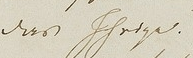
das Ihrige.
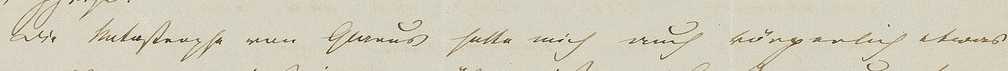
Die Katastrophe von Glarus hatte mich auch körperlich etwas
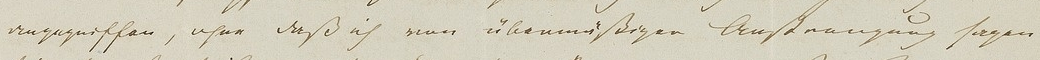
angegriffen, ohne daß ich von übermäßiger Anstrengung sagen
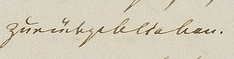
zurückgeblieben.
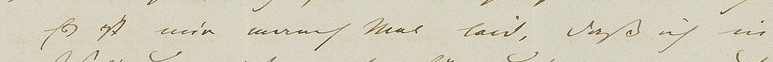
Es ist mir manch Mal leid, daß ich in
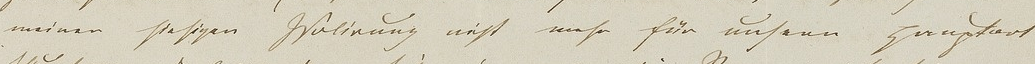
meiner hiesigen Isolirung nicht mehr für unsern Hauptort
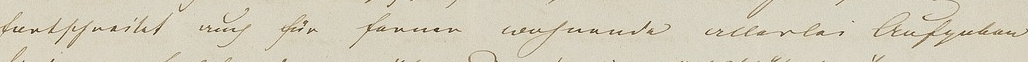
fortschreitet auch für ferner wohnende allerlei Aufgaben
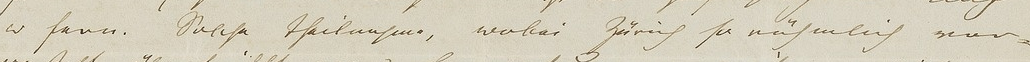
& fern. Solche Theilnahme, wobei Zürich so rühmlich vor-
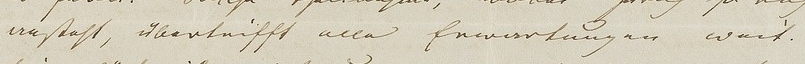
ansteht, übertrifft alle Erwartungen weit.
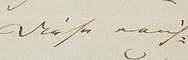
Diese reich-
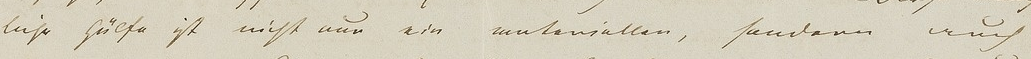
liche Hülfe ist nicht nur ein materieller, sondern auch
